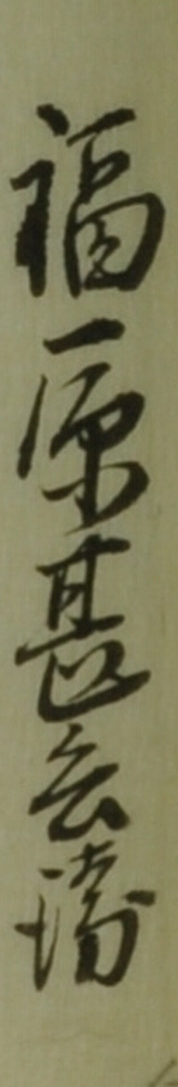福原甚兵衛
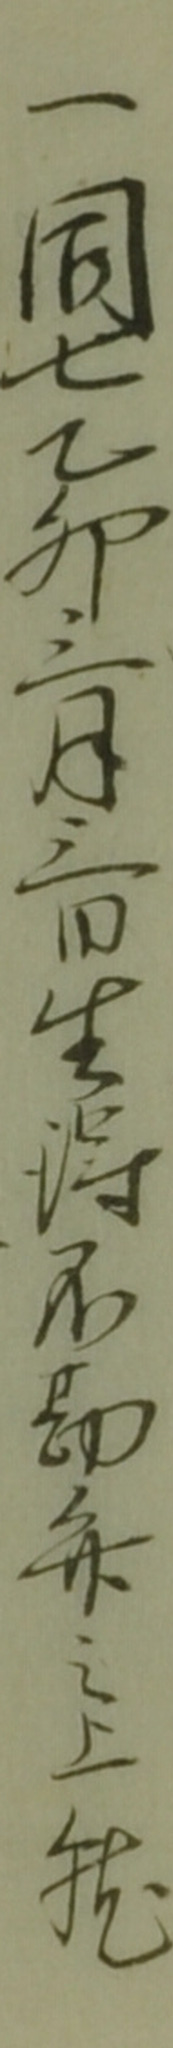一同七乙卯三月三日生得不勘弁之上就
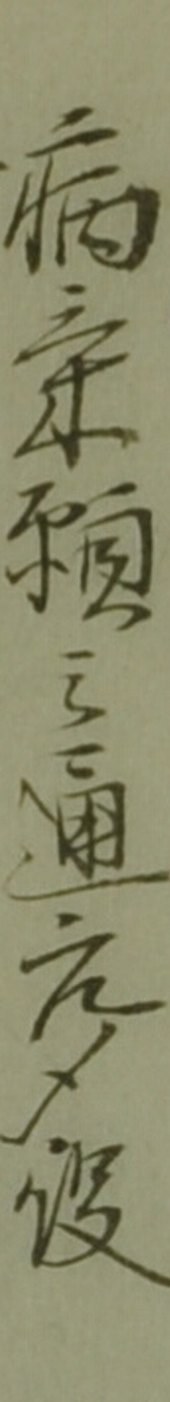病気願之通元〆役
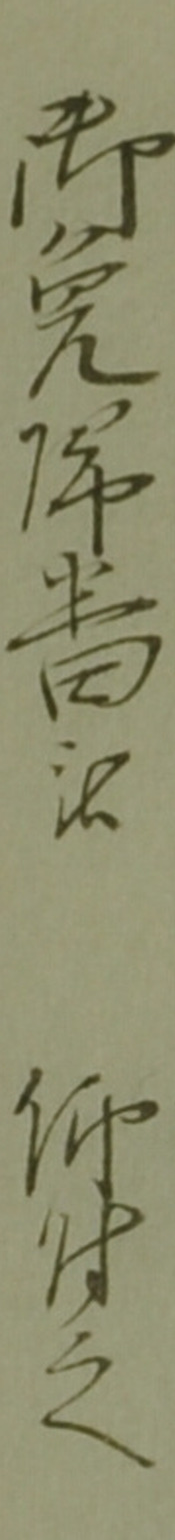御免帰番被仰付之
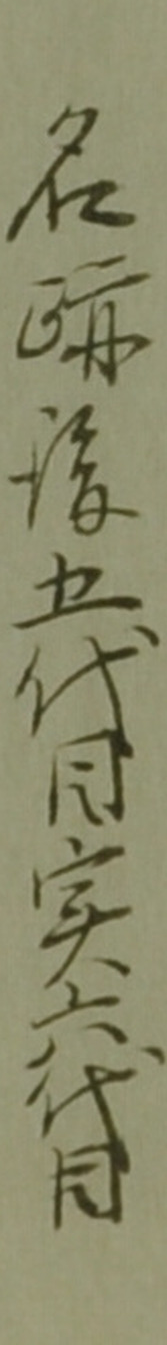名跡後五代目実六代目
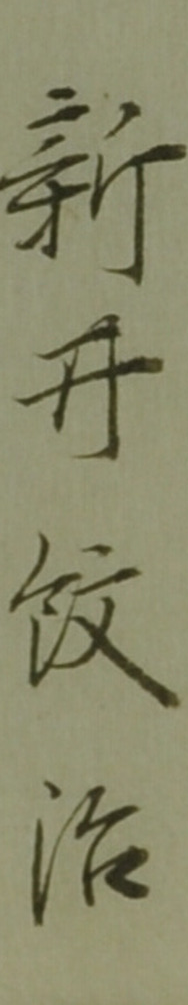新井紋治
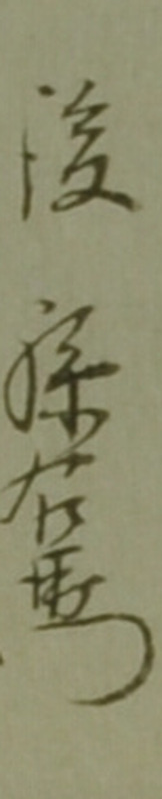後孫右衛門
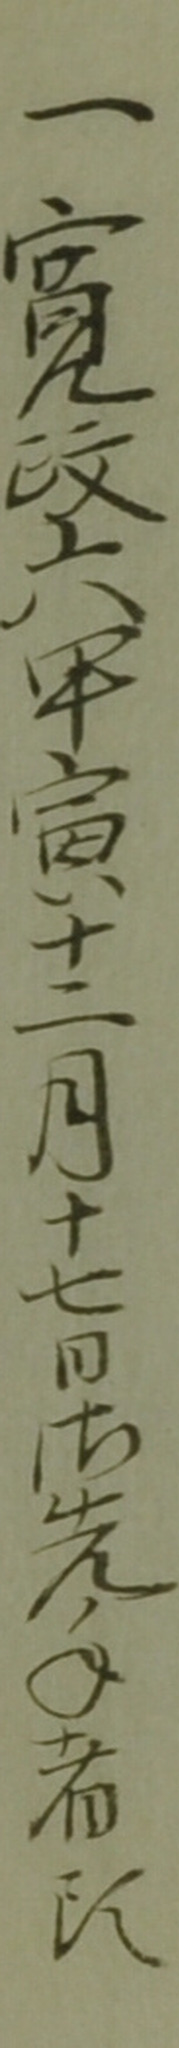一寛政六甲寅十二月十七日御先手者頭
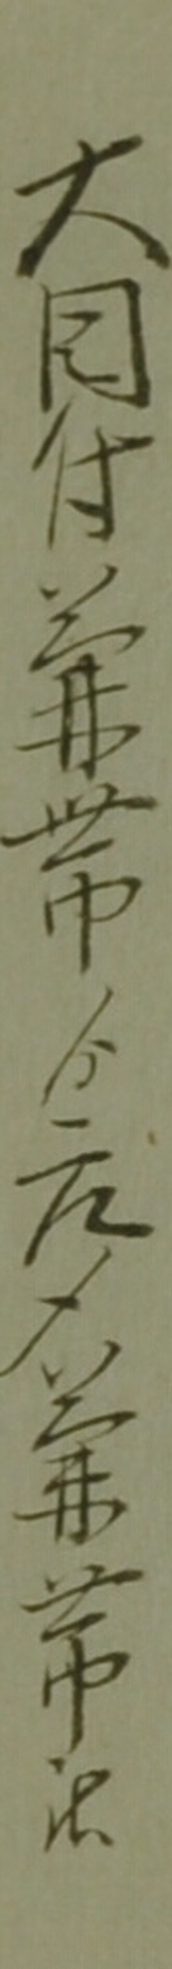大目付兼帯ゟ元〆兼帯被
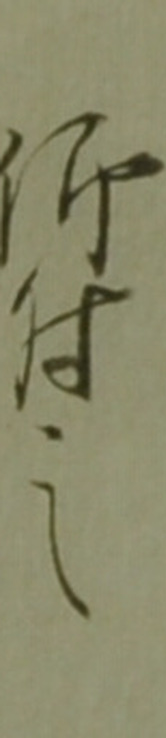仰付之
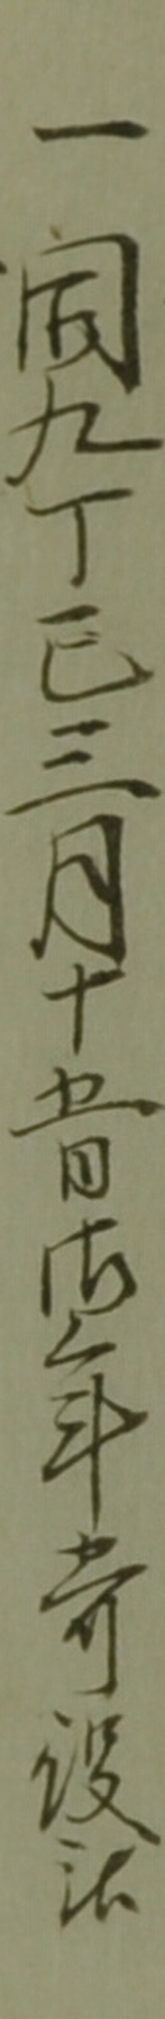一同九丁巳三月十五日御年寄役被
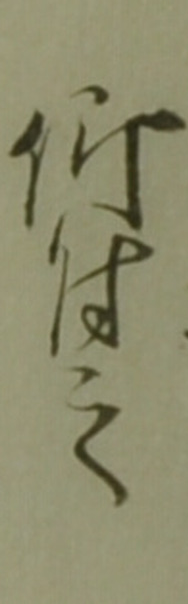仰付之
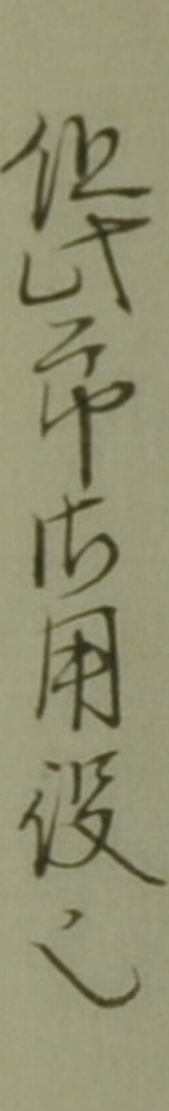但此節御用役也

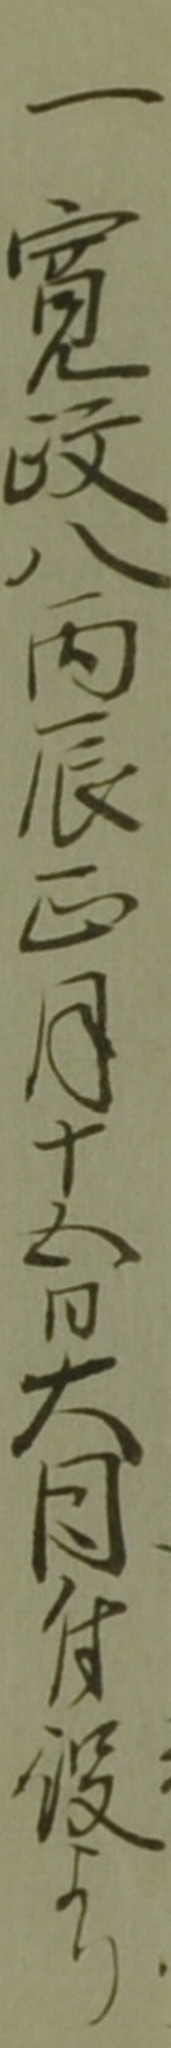一寛政八丙辰正月十五日大目付役より
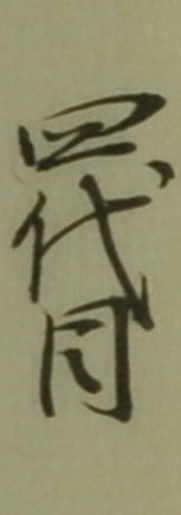四代目
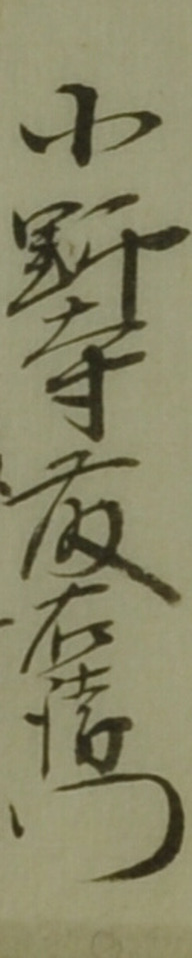小野寺籐右衛門
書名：諸御役代々録（七）
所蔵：伊那市立高遠町図書館・合同会社AMANE
